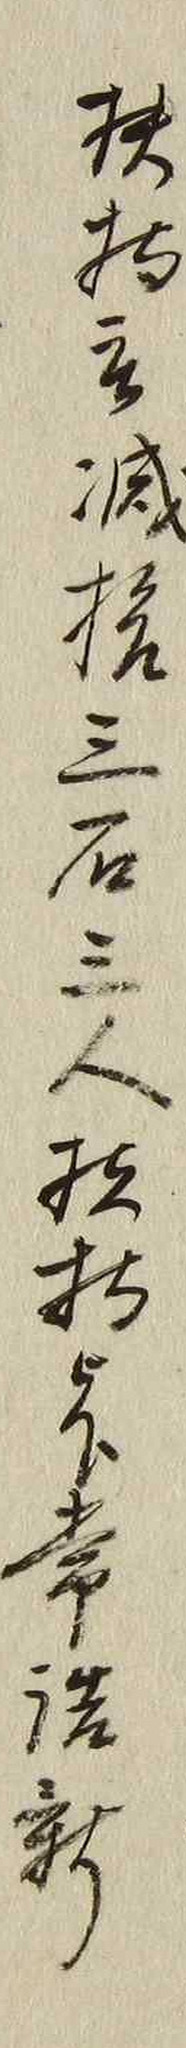扶持被減拾三石三人扶持被下常詰新
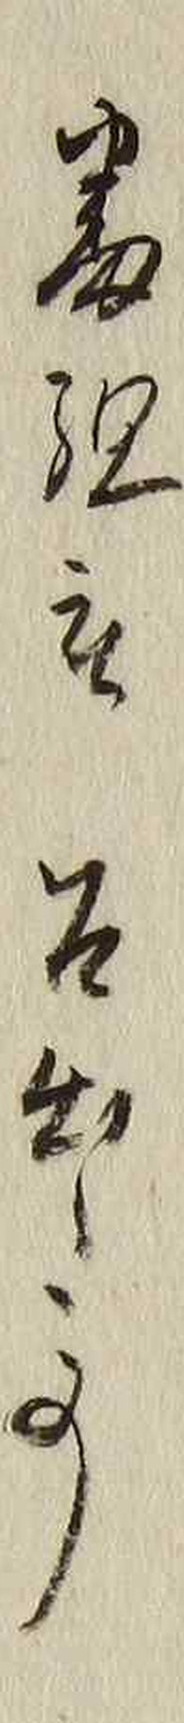番組被召出候事
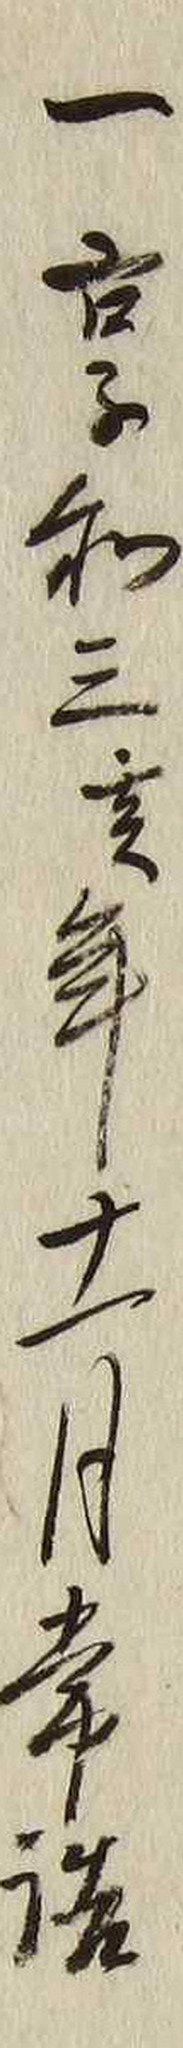一享和三亥年十一月常詰
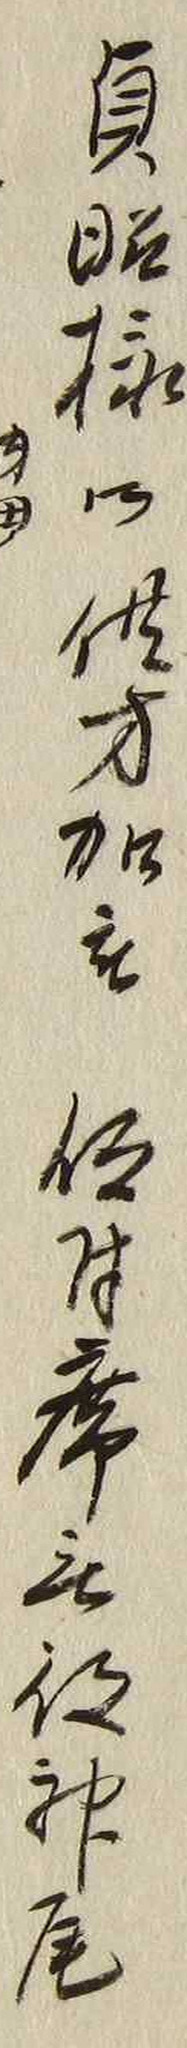貞昭様御供方被仰付席無役神尾
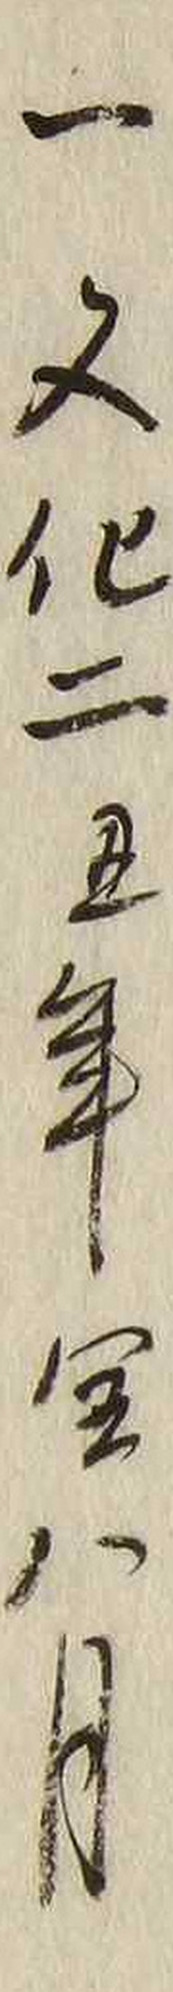一文化二丑年閏八月

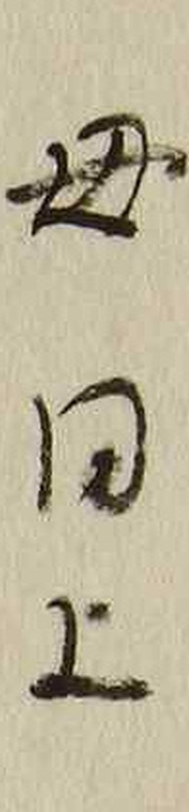母同上

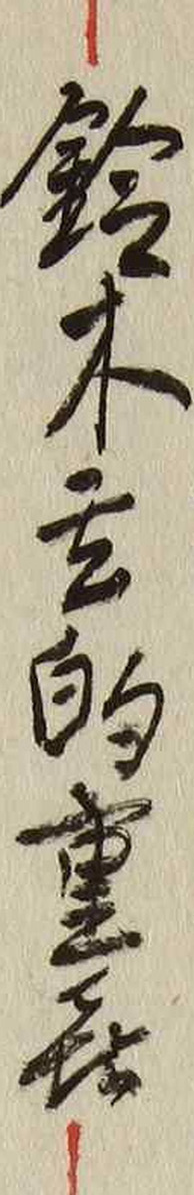鈴木玄的重喜
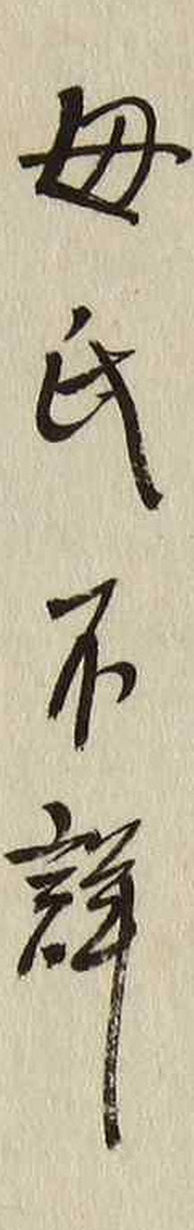母氏不詳
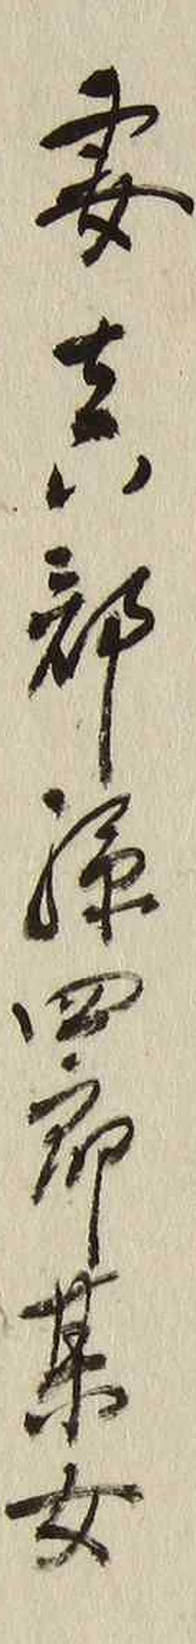妻真部孫四郎某女
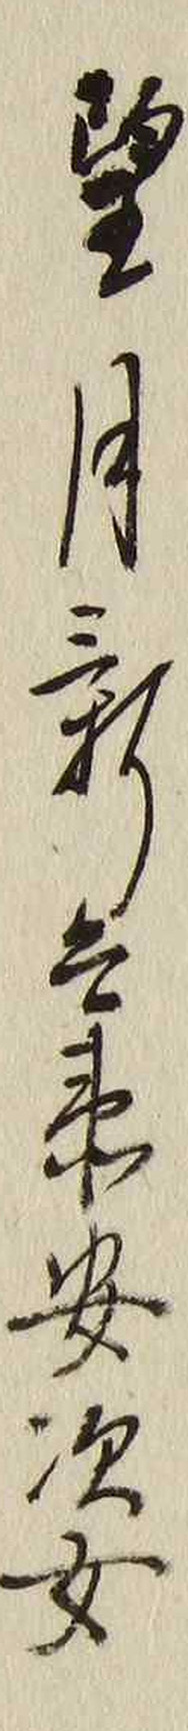望月新兵衛安次女

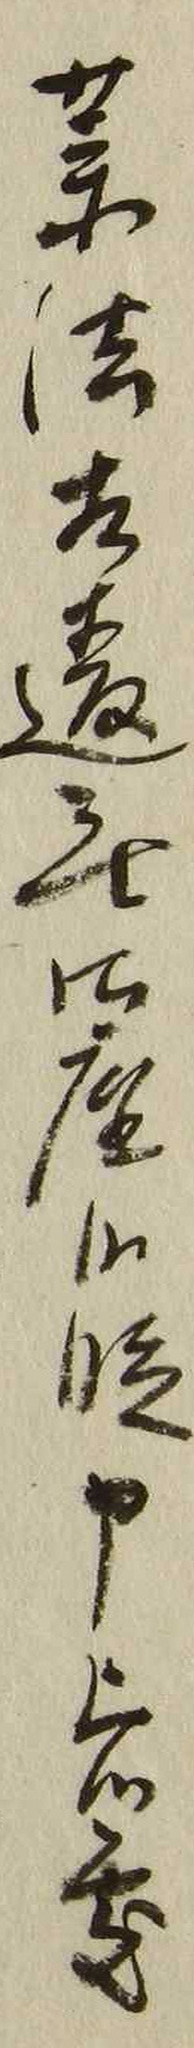薬法相違無御座候段申候処
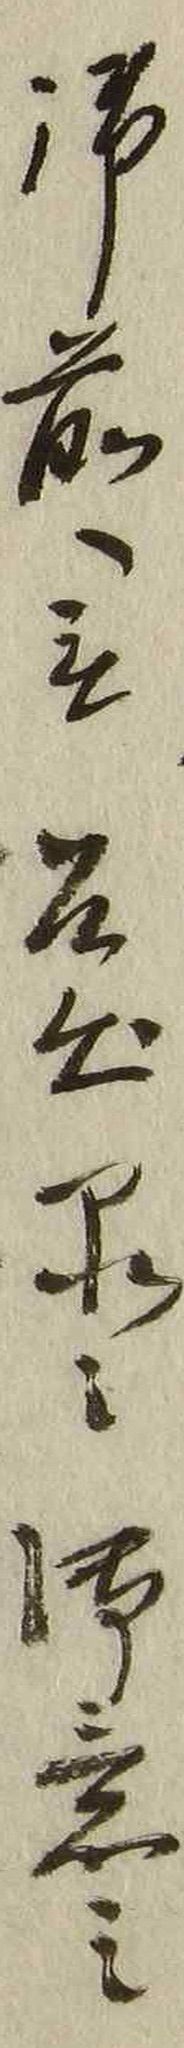御前へ被召出品々御意之
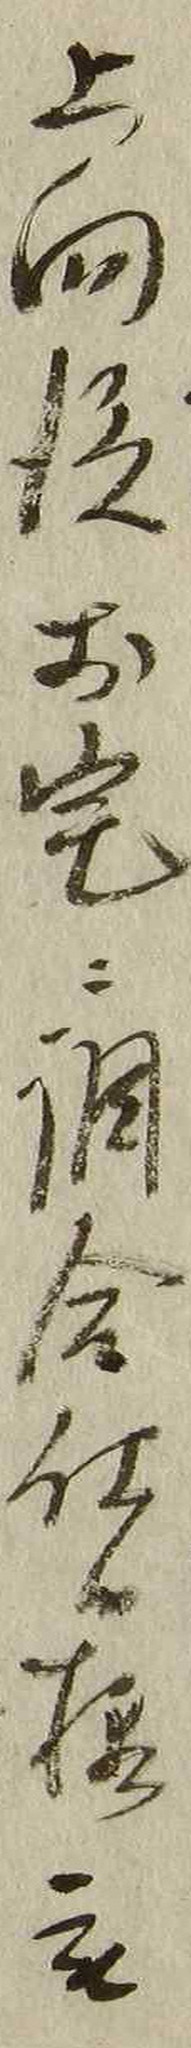上向後於宅ニ調合仕候様被
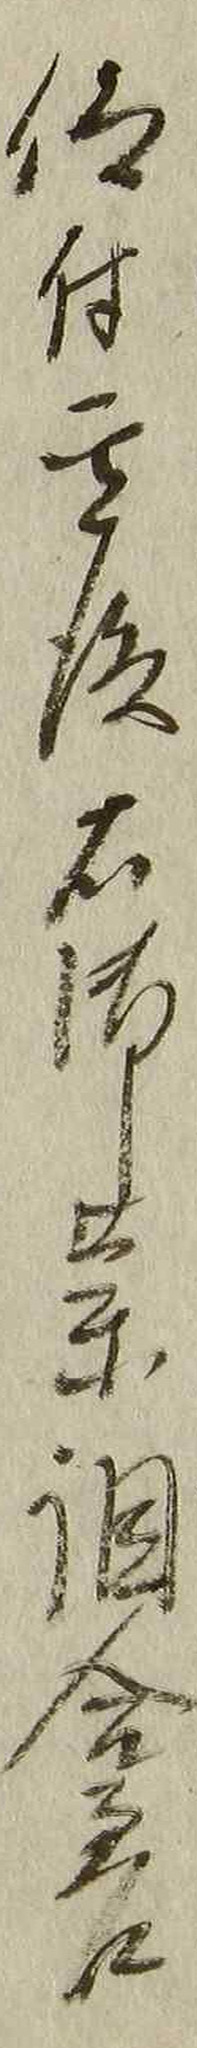仰付其後右御薬調合差
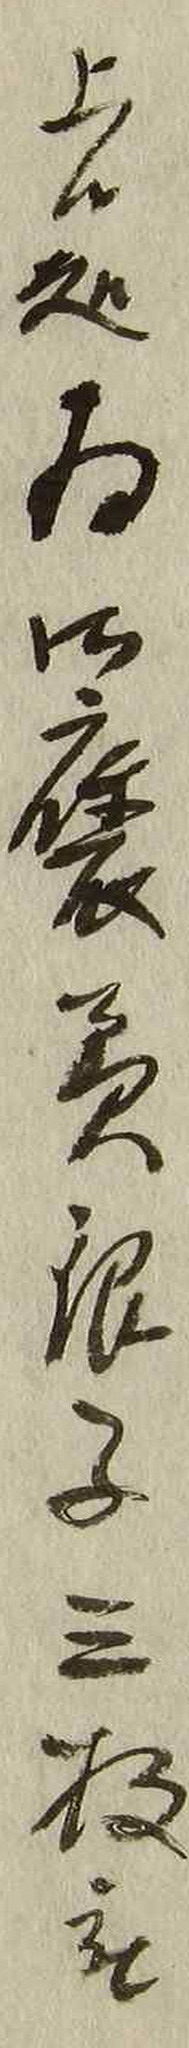上候処為御褒美銀子三枚被
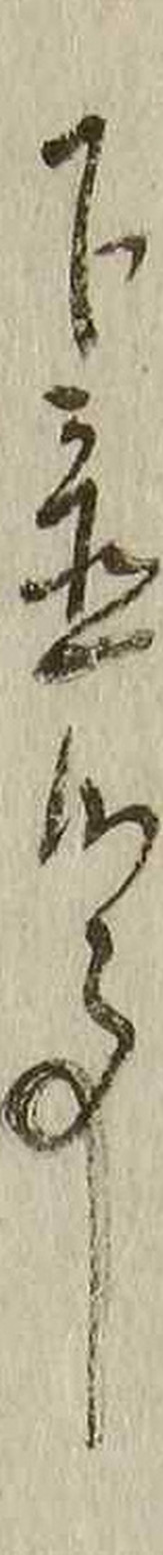下置候事
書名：諸士系譜　巻之353　す之部3
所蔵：会津若松市立会津図書館
